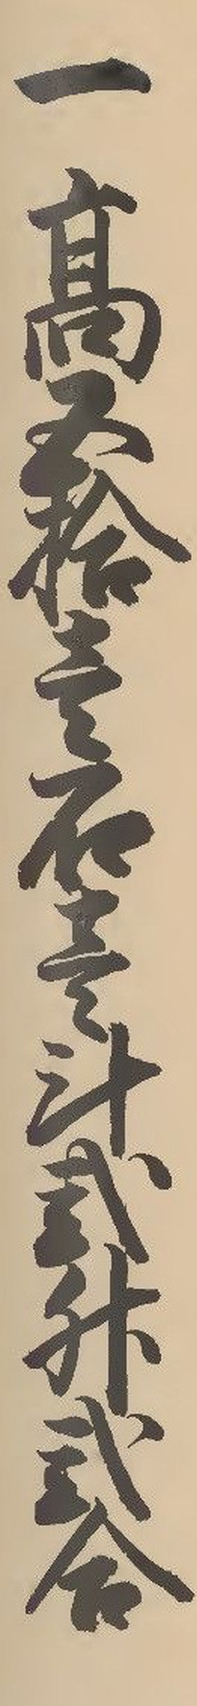一髙五拾壱石壱斗弐升弐合
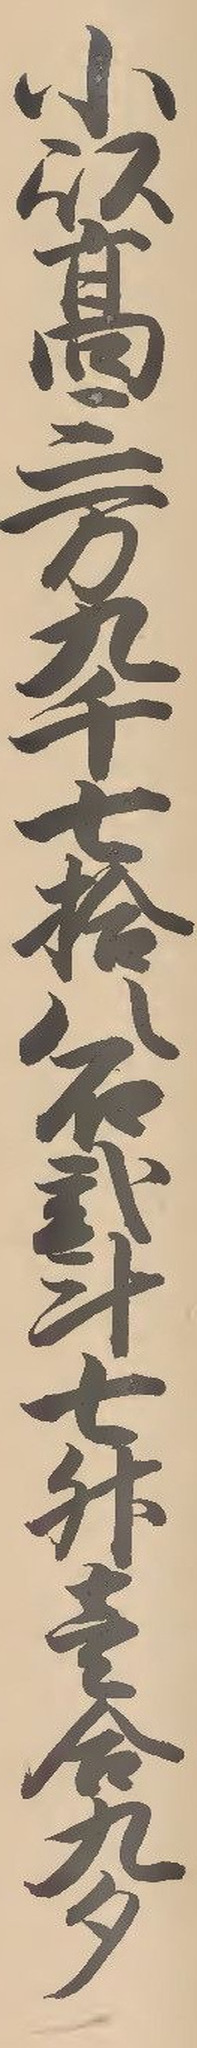小以髙三万九千七拾八石弐斗七升壱合九夕

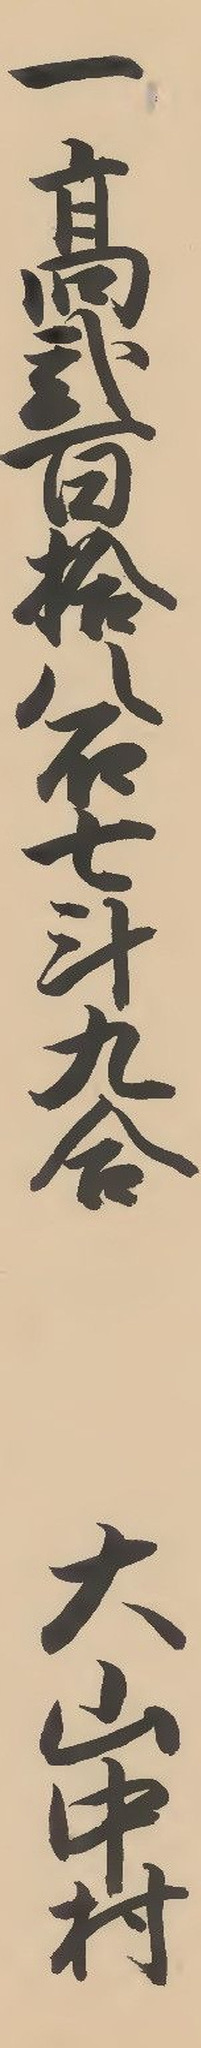一髙弐百拾八石七斗九合大山中村
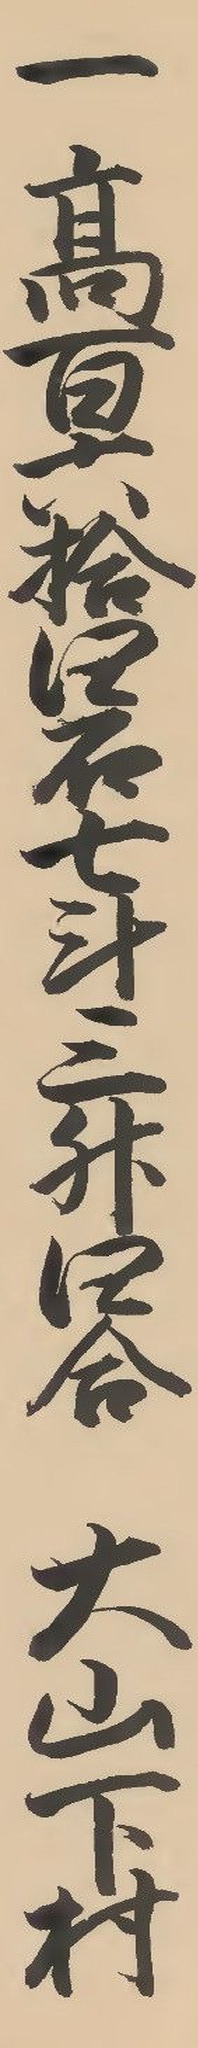一髙百六拾四石七斗三升四合大山下村
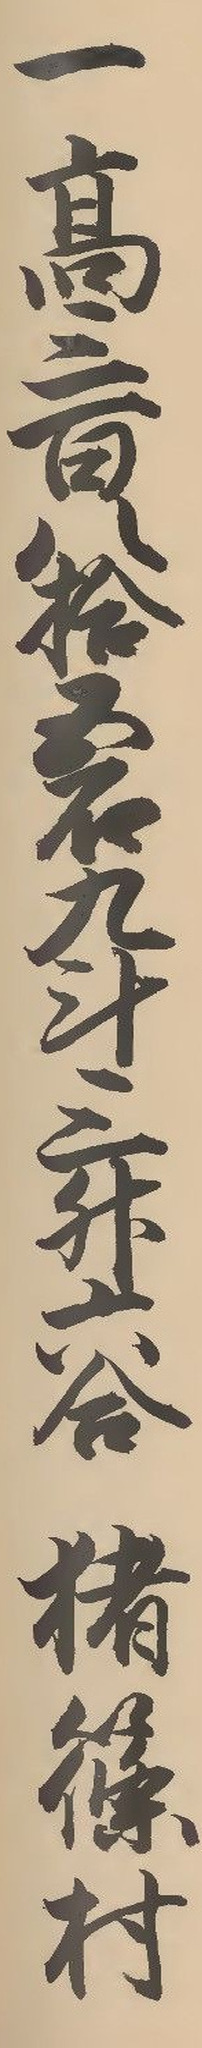一髙三百八拾五石九斗三升六合猪篠村
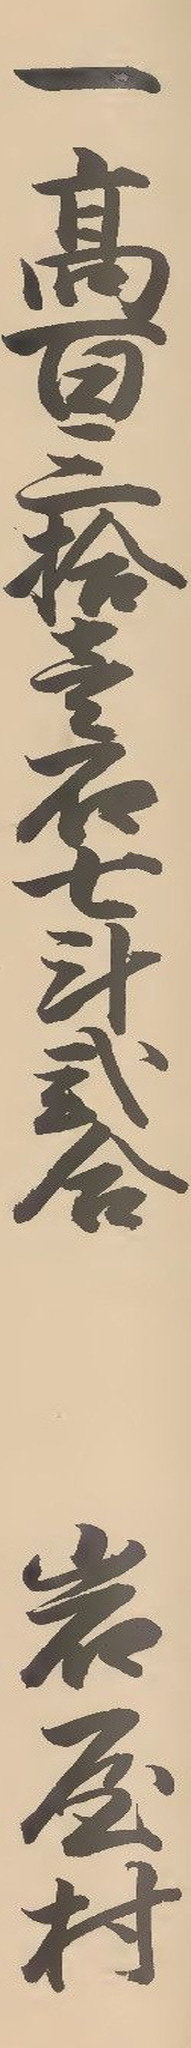一髙百三拾壱石七斗弐合岩屋村
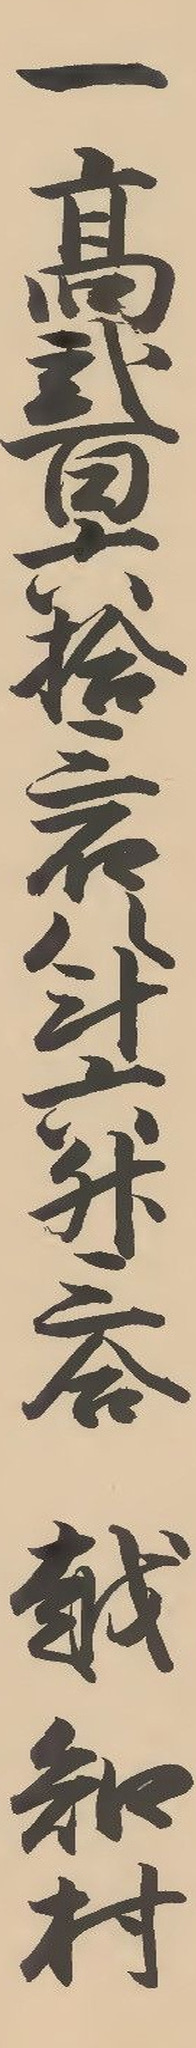一髙弐百六拾三石八斗六升三合越知村
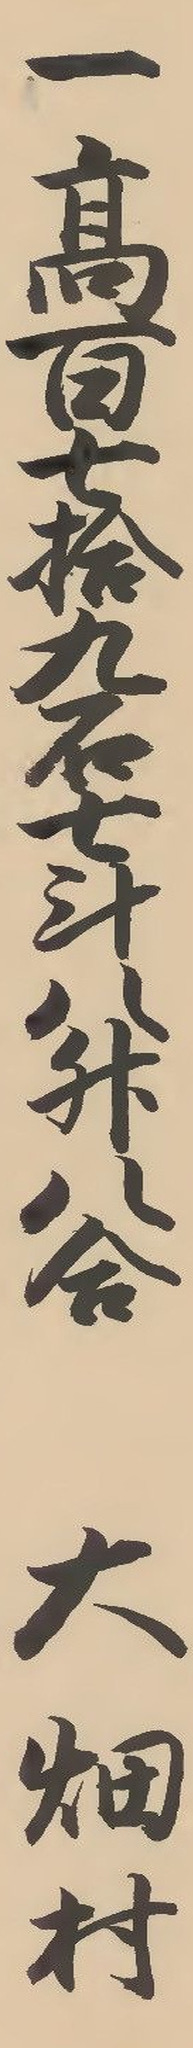一髙百七拾九石七斗八升八合大畑村
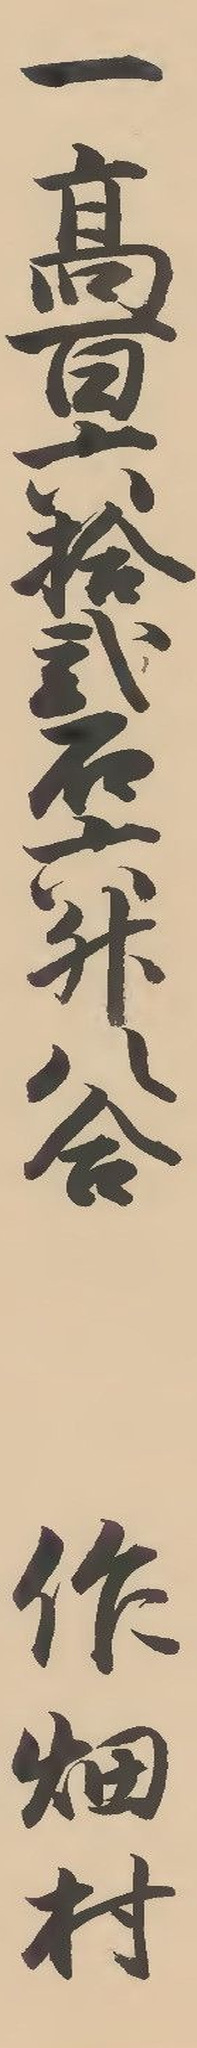一髙百六拾弐石六升八合作畑村

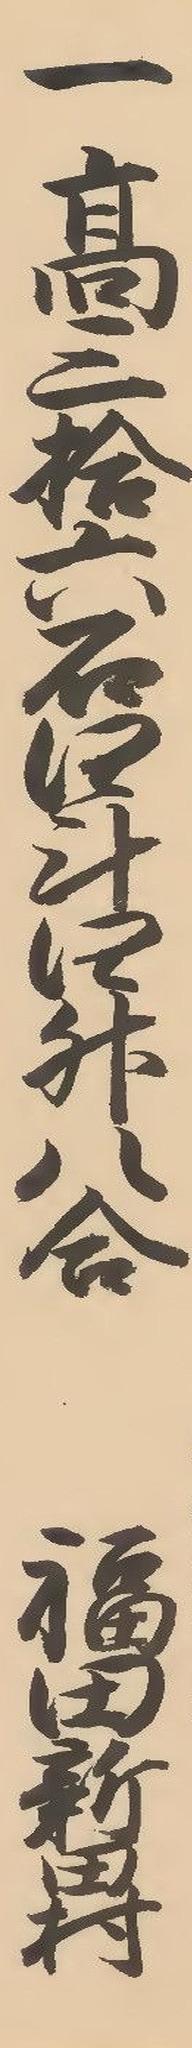一髙三拾六石四斗四升八合福田新田村
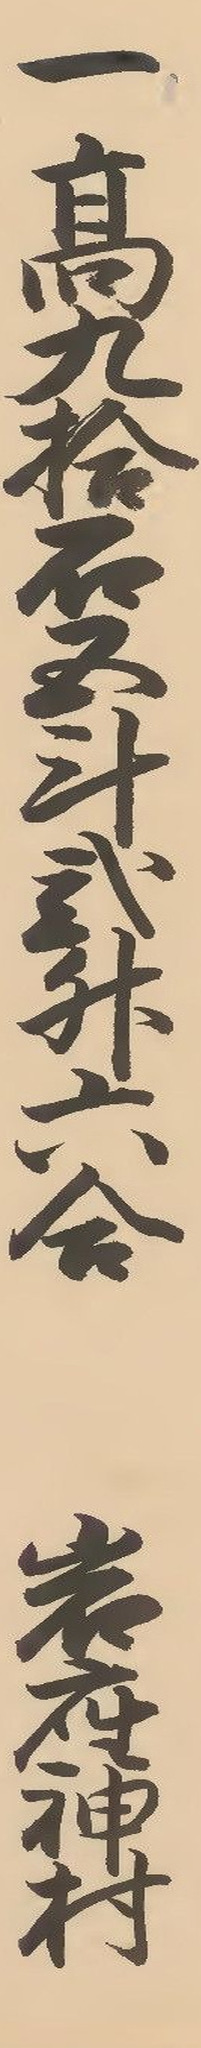一髙九拾石五斗弐升六合岩座神村
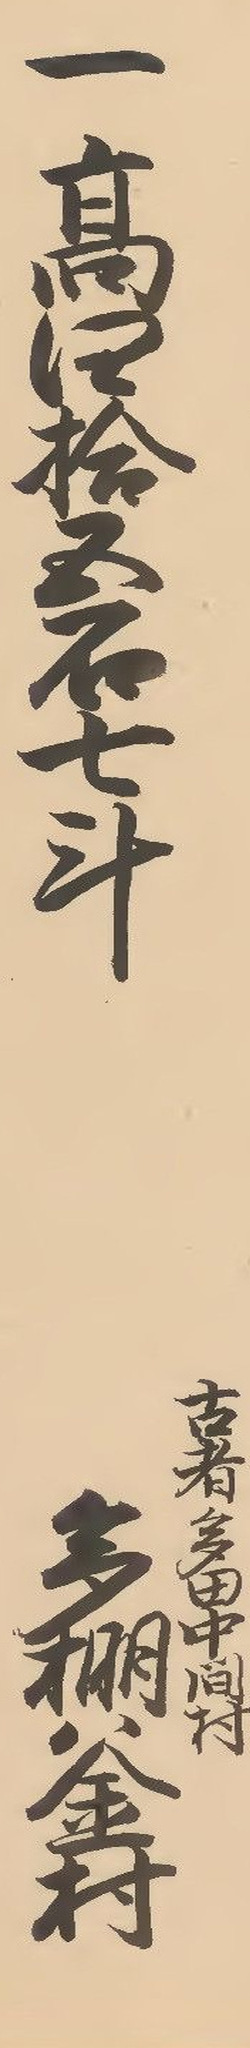一髙四拾五石七斗多棚釜村
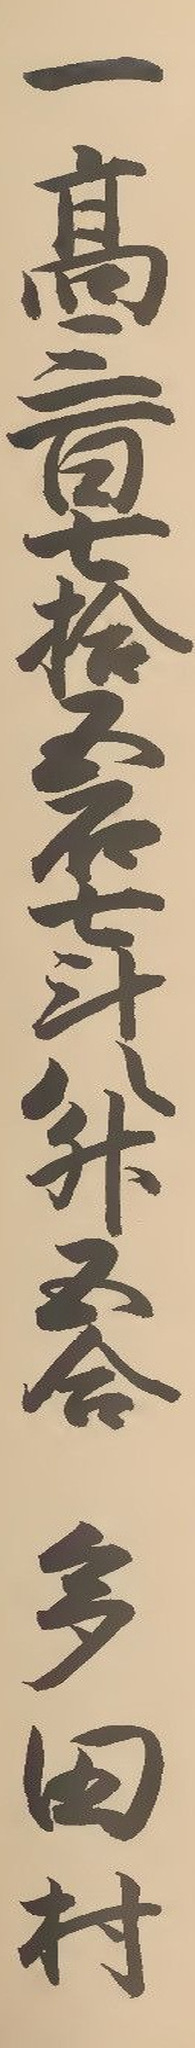一髙三百七拾五石七斗八升五合多田村
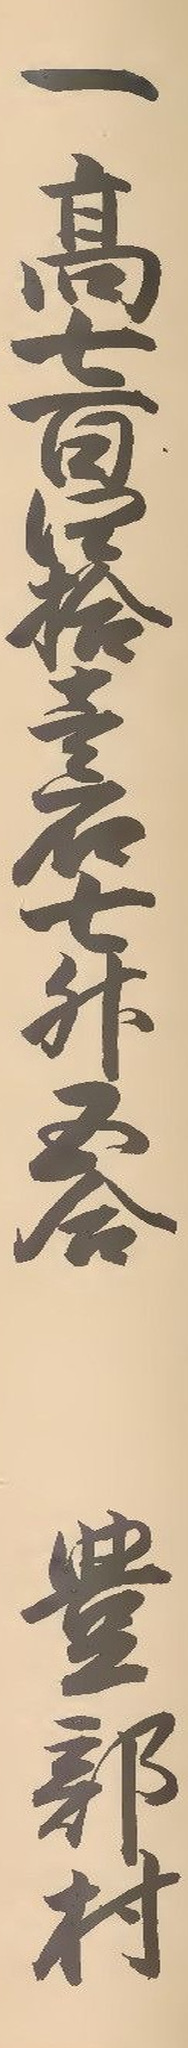一髙七百四拾壱石七升五合豊部村
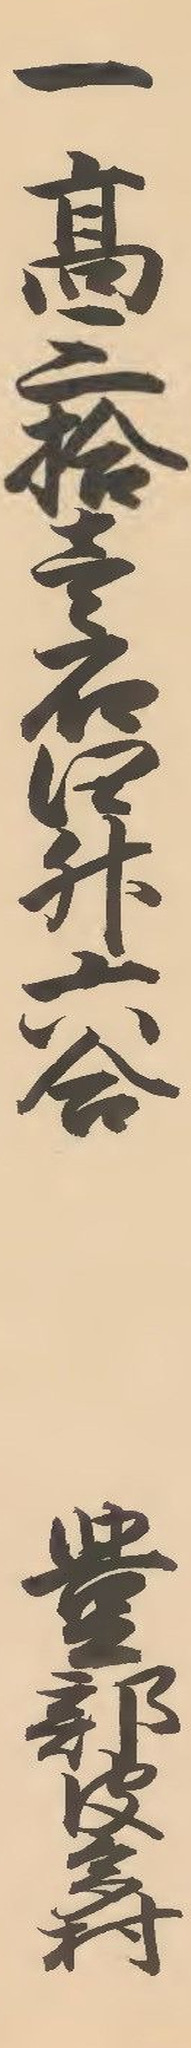一髙三拾壱石四升六合豊部皮多村
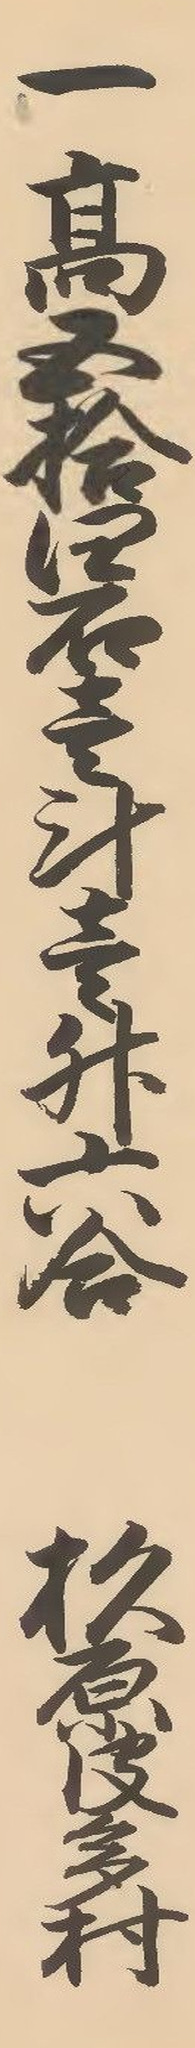一髙五拾四石壱斗壱升六合杦原皮多村
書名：播磨国郷帳
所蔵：国立公文書館 National Archives of Japan
